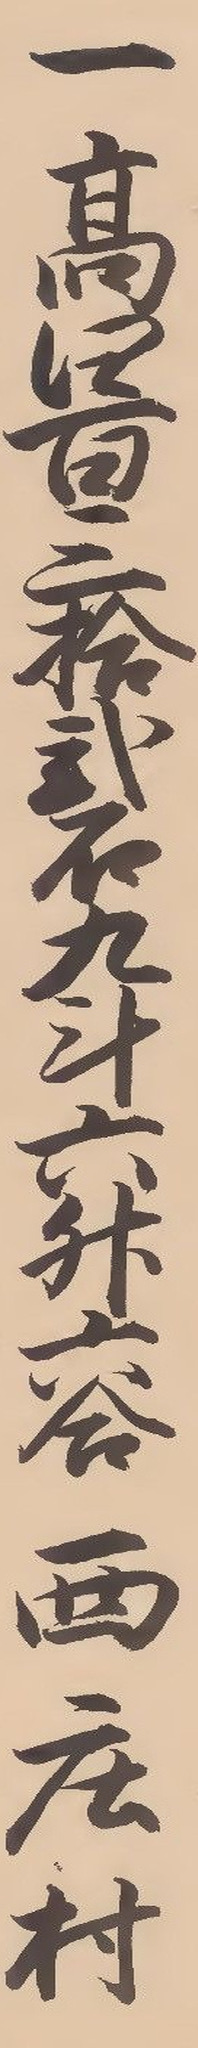一髙四百三拾弐石九斗六升六合西庄村
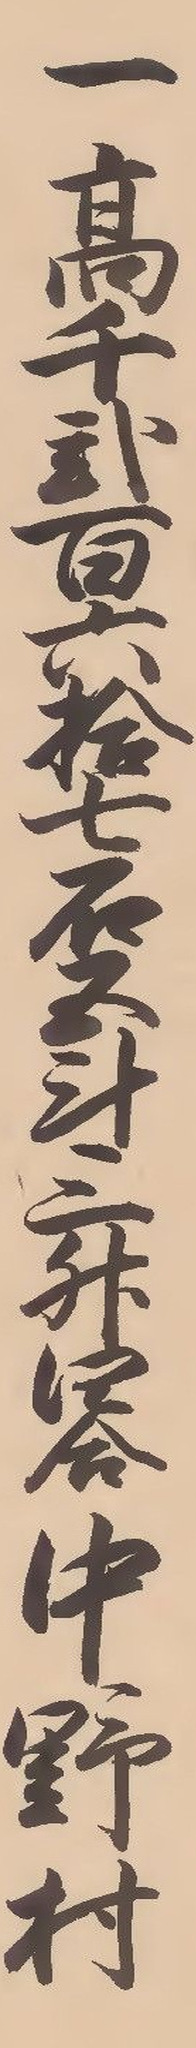一髙千弐百六拾七石五斗三升四合中野村
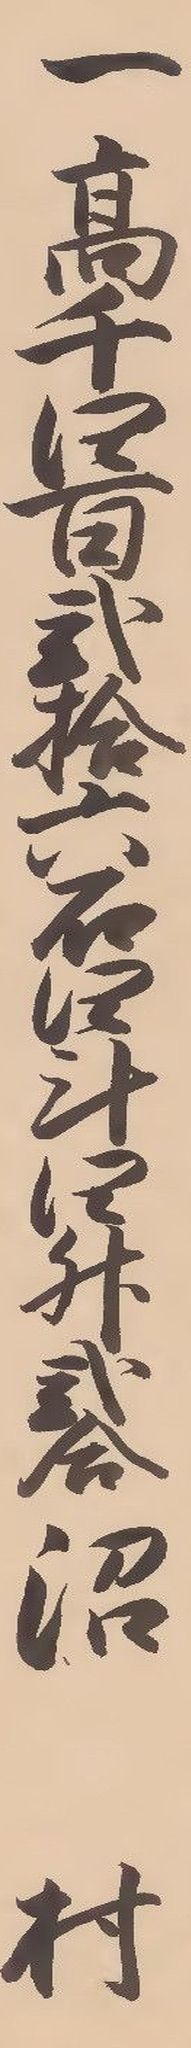一髙千四百弐拾六石四斗四升弐合沼村
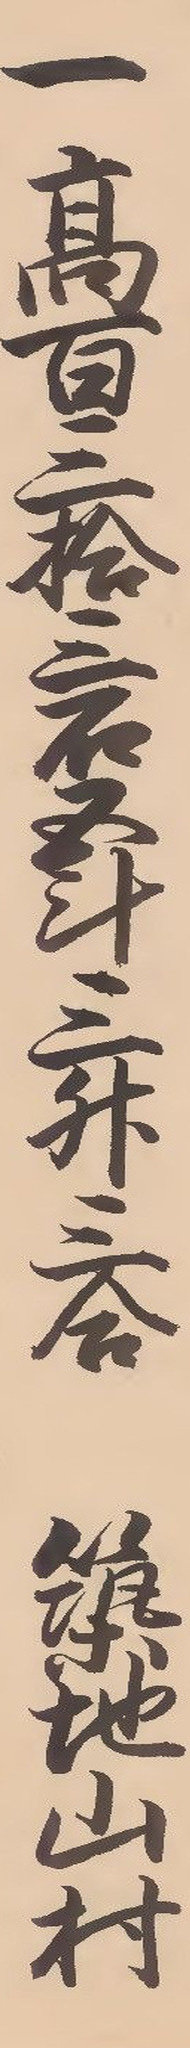一髙百三拾三石五斗三升三合築地山村
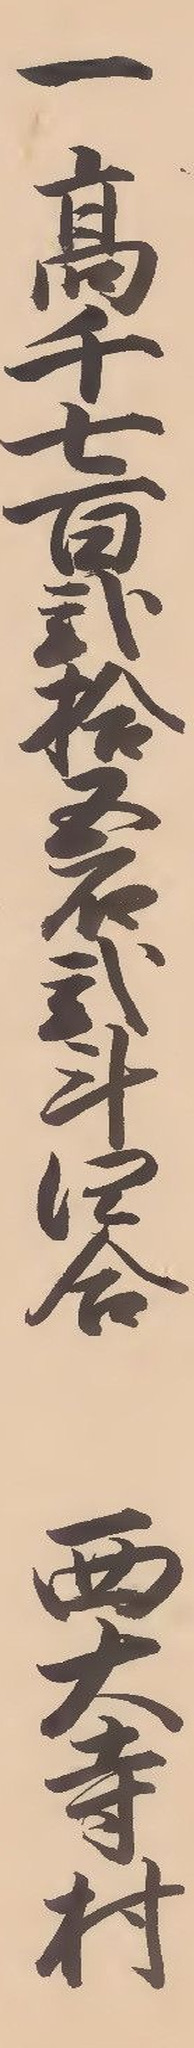一髙千七百弐拾五石弐斗四合西大寺村
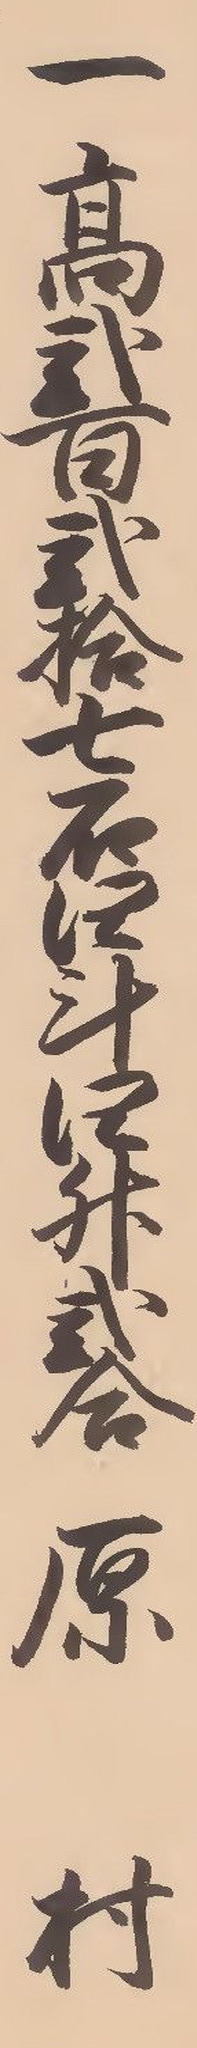一髙弐百弐拾七石四斗四升弐合原村
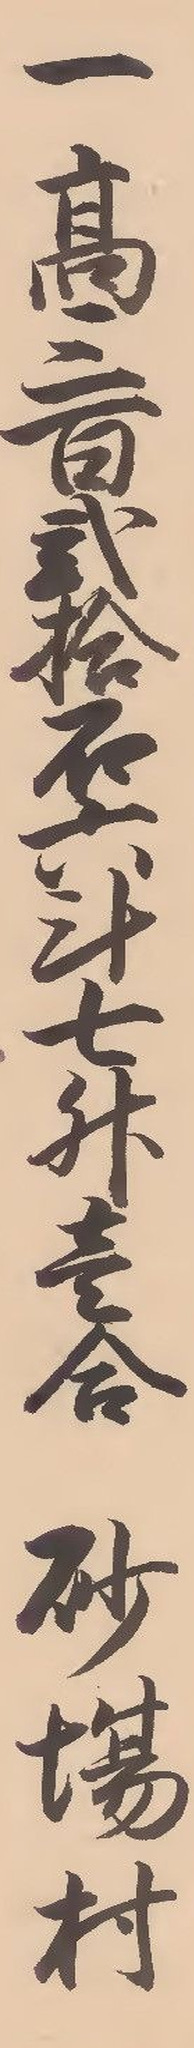一髙三百弐拾石六斗七升壱合砂場村

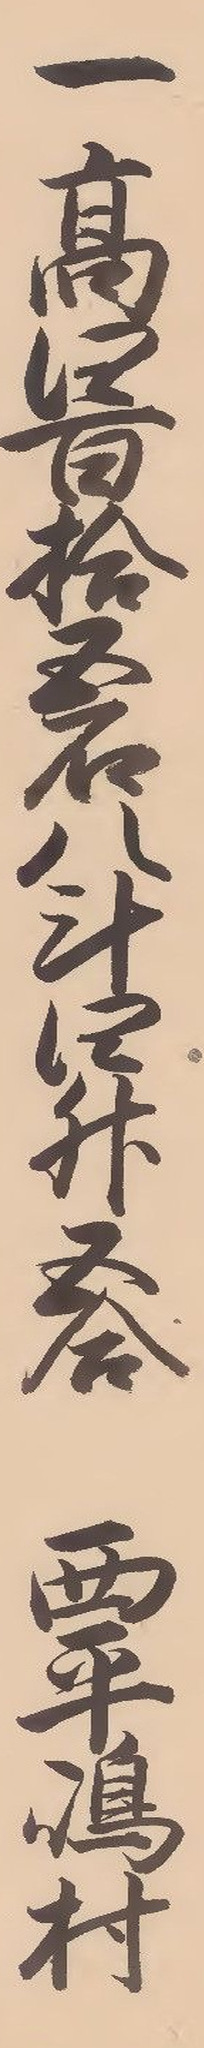一髙四百拾五石八斗四升五合西平嶋村
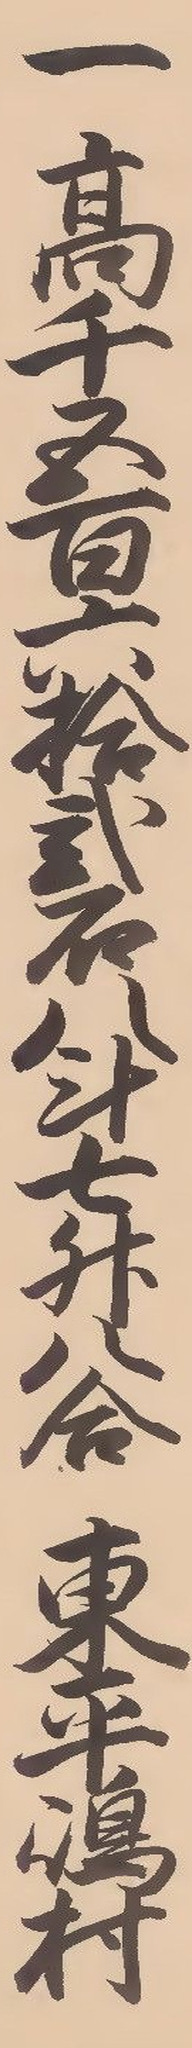一髙千五百六拾弐石八斗七升八合東平嶋村
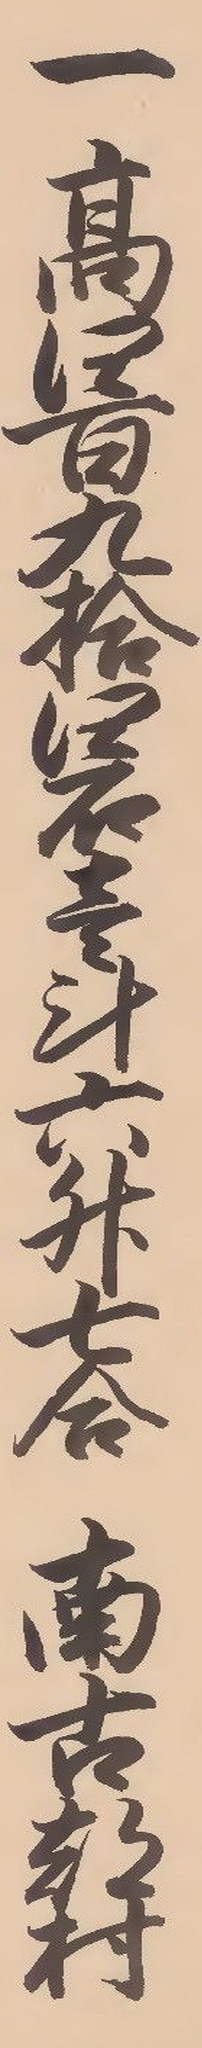一髙四百九拾四石壱斗六升七合南古都村
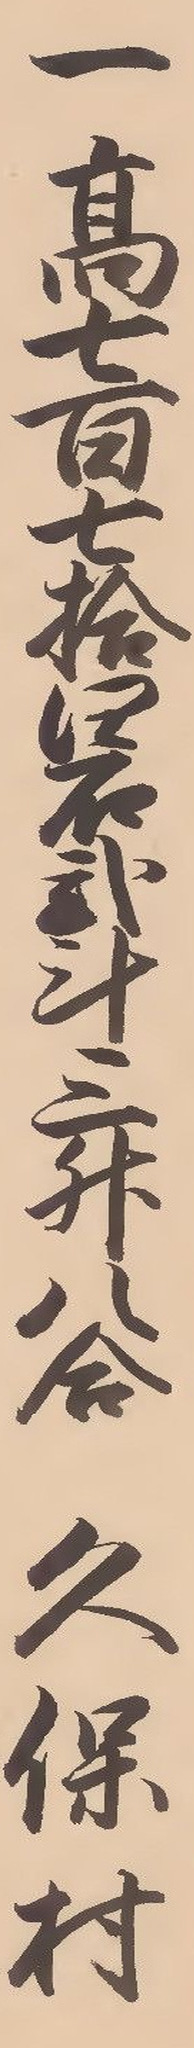一髙七百七拾四石弐斗三升八合久保村
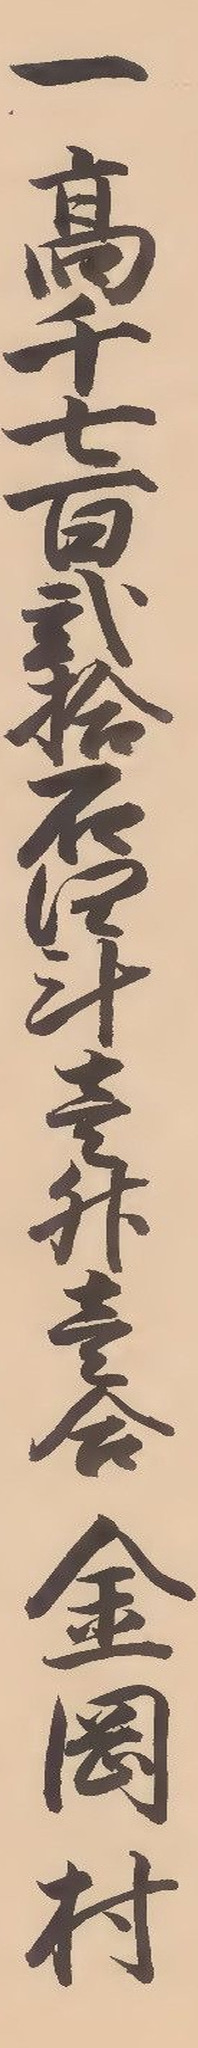一髙千七百弐拾石四斗壱升壱合金岡村
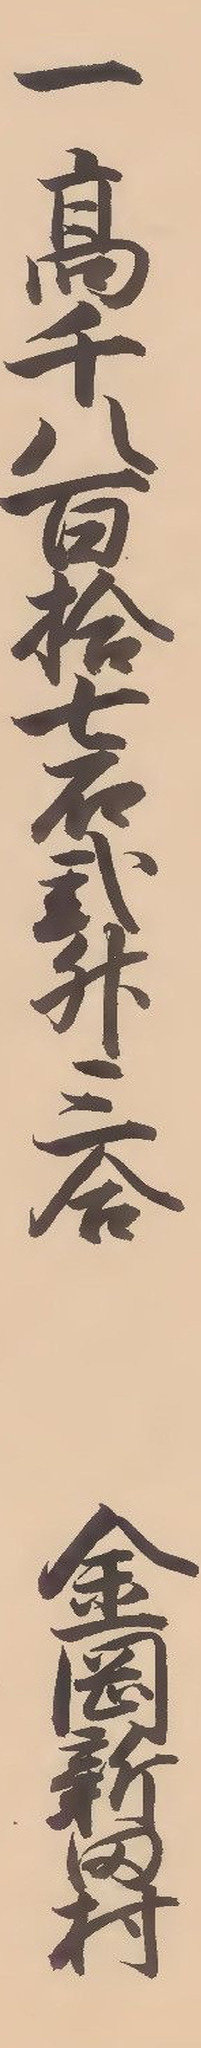一髙千八百拾七石弐升三合金岡新田村
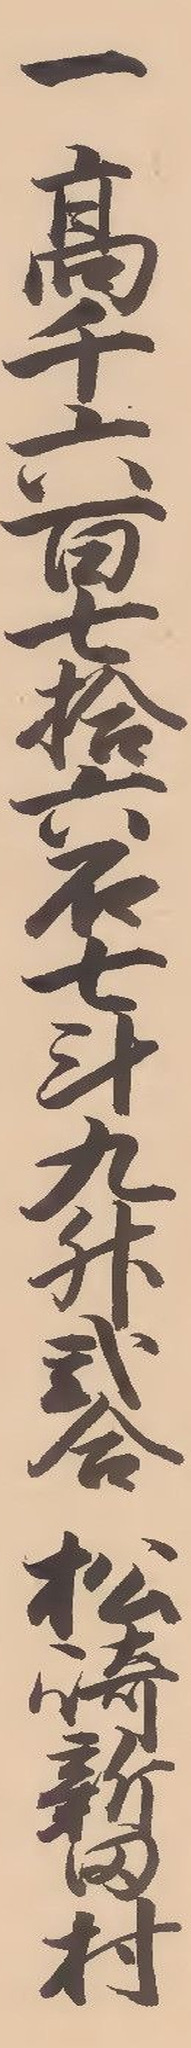一髙千六百七拾六石七斗九升弐合松崎新田村
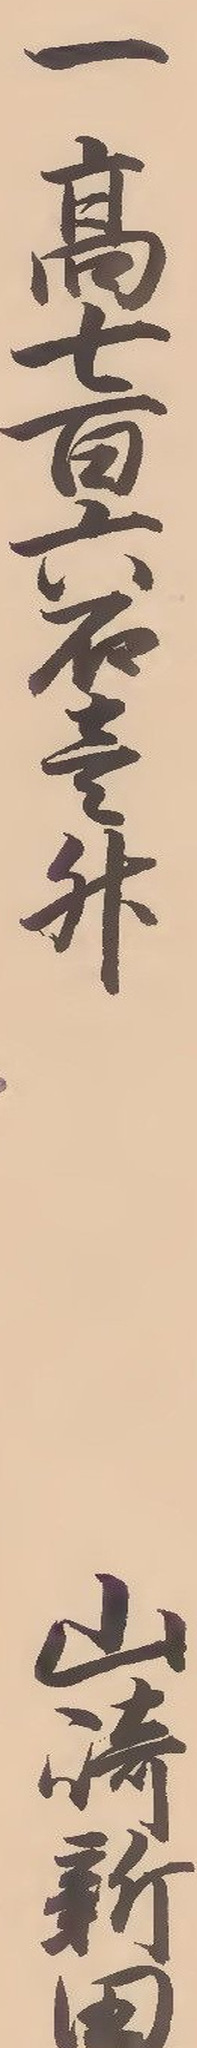一髙七百六石壱升山崎新田

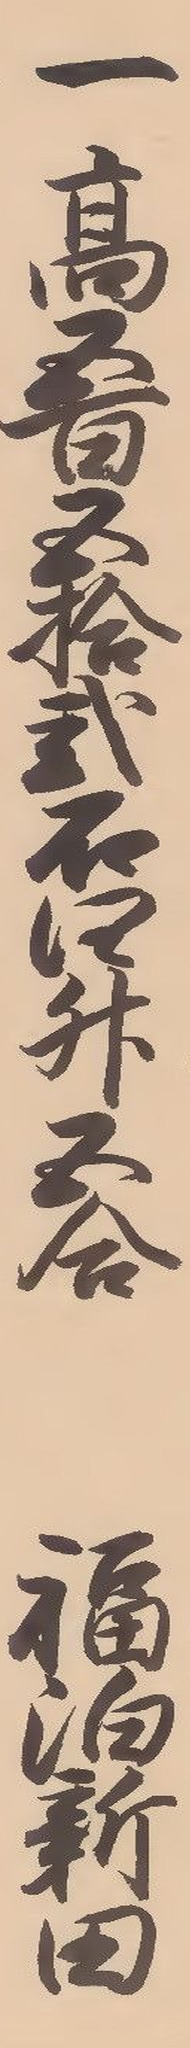一髙五百五拾弐石四升五合福泊新田
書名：備前国郷帳
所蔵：国立公文書館 National Archives of Japan
